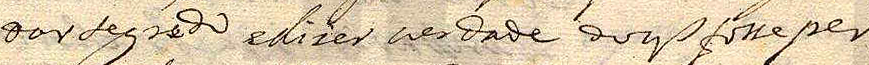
dar segredo E dizer uerdade do q̄ fosse per
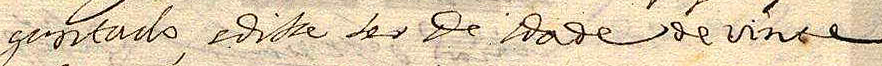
guntado, E disse ser de idade de vinte
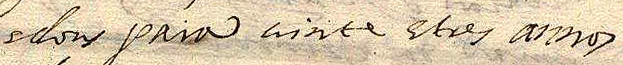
E dous para uinte E tres annos
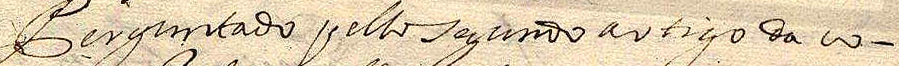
Perguntado pello segundo artigo da co
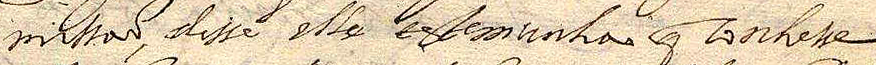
missaõ, disse Elle testemunha q̄ conhesse
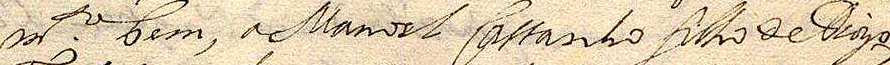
m.to bem, a Manoel Castanho filho de Diogo
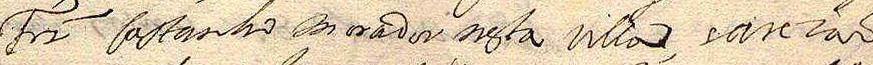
Frz̄ Castanho morador nesta villa, E a rezaõ
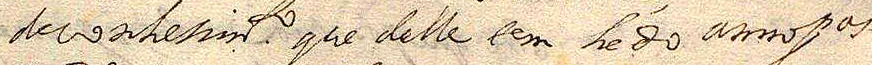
de conhecim.to que delle tem he do anno pas
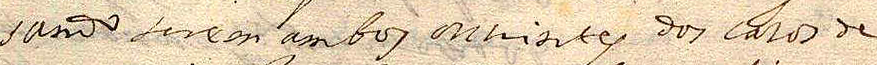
sando serem ambos ouuintes dos cazos de
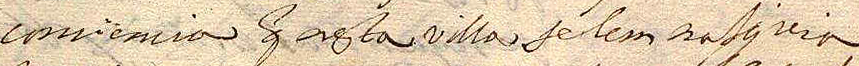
conciencia q̄ nesta villa se tem na Igreia
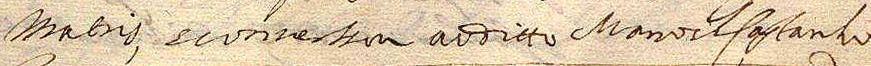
matris, E conuerssou ao ditto Manoel Castanho
